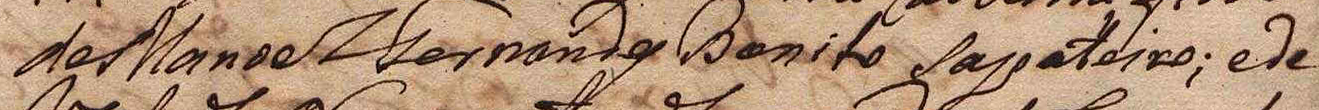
de Manoel Fernandes Bonito sapateiro; e de
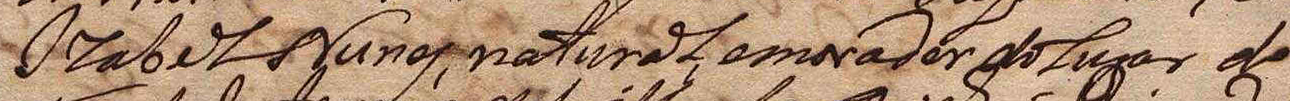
Izabel Nunes, natural, e morador do Lugar do
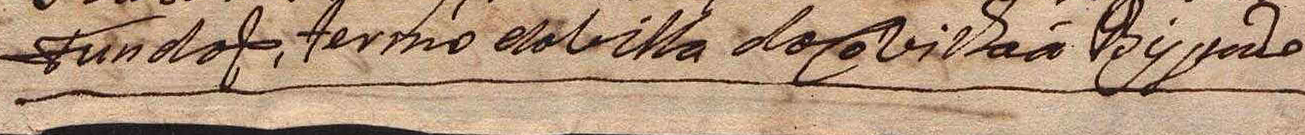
Fundaõ, termo da villa do Covilhaã Bispado
